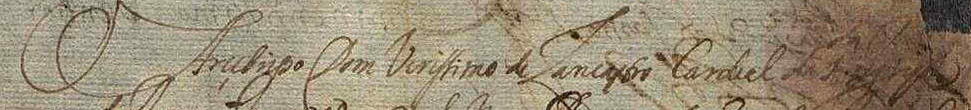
O Arcebispo Dom Verissimo de Lancastro Cardeal da s.ta Igreja
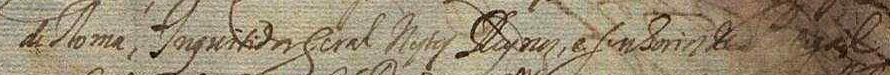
de Roma, Inquisidor Geral nestes Reynos, e senhorios de Portugal
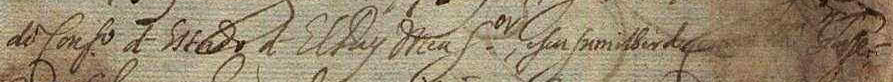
do Cons.o de Estado de El Rey meu s.or, e seu sumilher da Co_ _ Faze
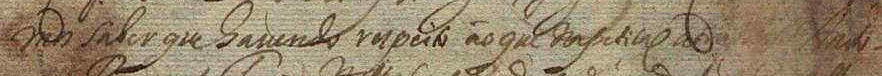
mos saber que hauendo respeito ao que na petiçaꝭ _ _ Anto
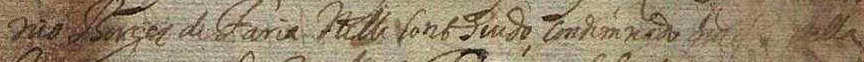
nio Borges de Faria Nella contheudo, condemnado que f_ pella
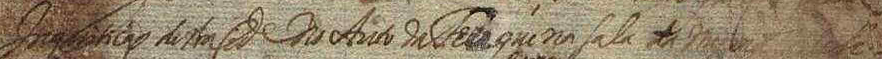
Inquisiçaꝭ desta Cide do Auto da Fee_ que na sala da _ cele
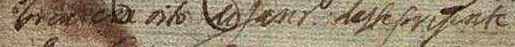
brou em oito de Janr.o deste presente
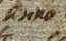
anno
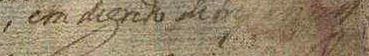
em degredo de tres annos
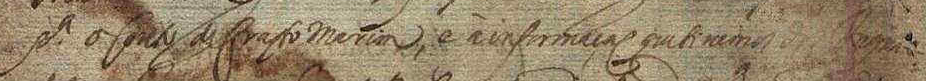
p.a o Couto de Crastro marim, e a informaçaꝭ que tiuemos dos Inqui
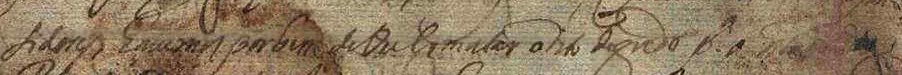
sidores, hauemos por bem de lhe comutar o dito degredo p.a o _
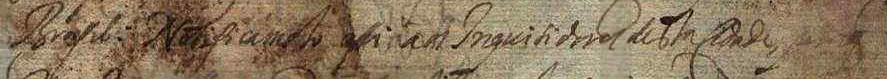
Brasil: Notificamolo assima os Inquisidores desta Cidade, porq̄
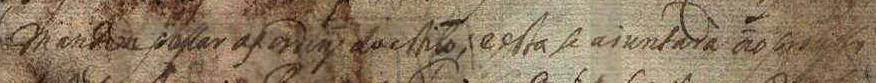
mandem passar as ordens do estilo, e esta se aiuntarà ao processo
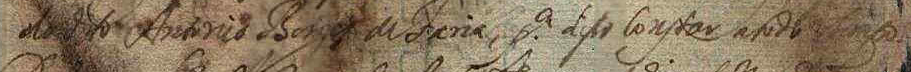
do dito Antonio Borges de Faria, p.a disso constar a todo tempo
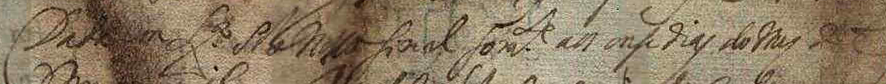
Dada em Lx.a sob nosso sinal som.te aos onse dias do mes de
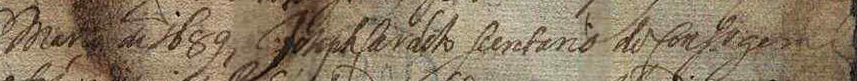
março de 1689, Joseph Cardoso secretario do Cons.o geral
